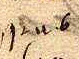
p 11.6
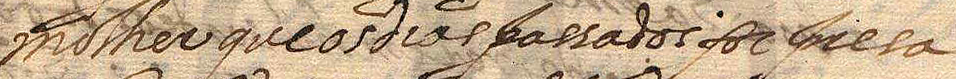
molher que os dias passados foi presa
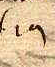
t 19
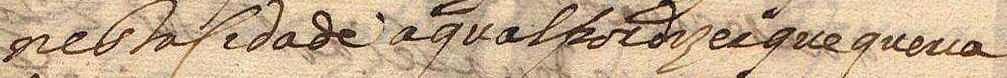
nesta Cidade a qual por dizer que queria
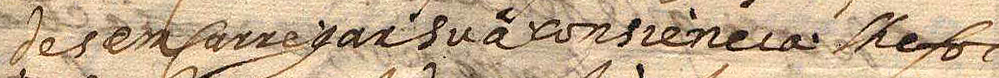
desemCarregar sua consiencia lhe foi
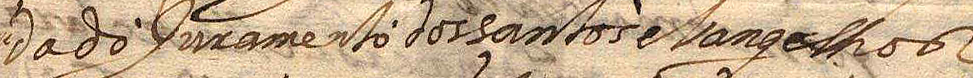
dado Juramento dos santos evangelhos
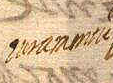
iuramentu
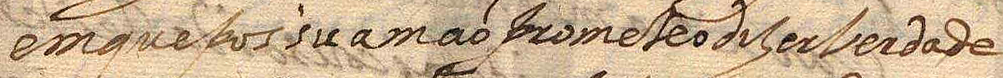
em que pos sua maõ prometeo dizer verdade
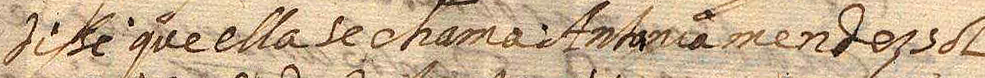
disse que ella se chama Antonia mendez sol
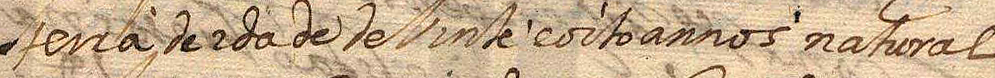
teira de idade de vinte e oito annos natural
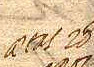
aetas 28
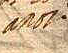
anos
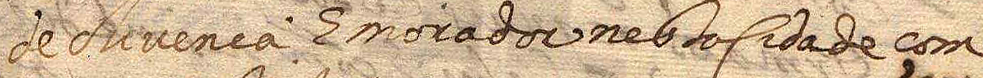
de oliuença E morador nesta Cidade com
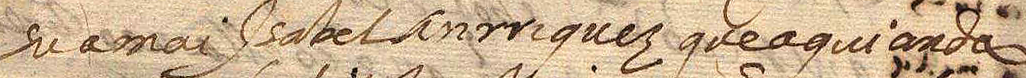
sua mai Jsabel anrriquez que aqui anda
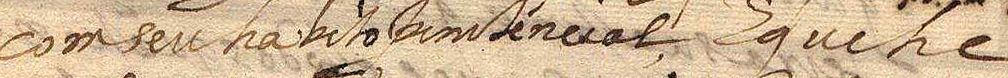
com seu habito penitencial, E que he
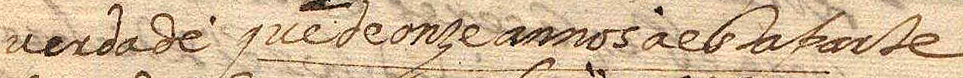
uerdade que de onze annos a esta parte
